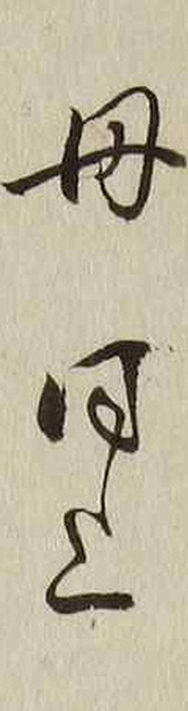母同上
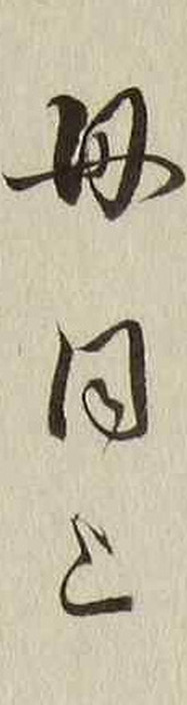母同上
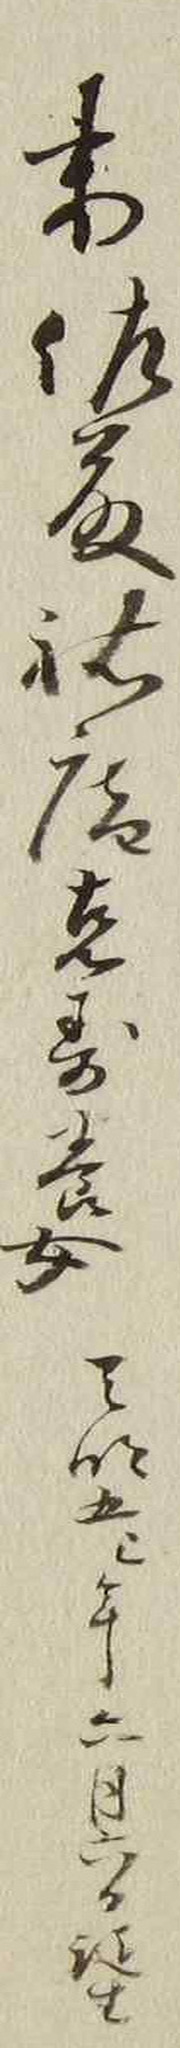妻佐藤裕庵克寿養女天明五巳年六月六日誕生
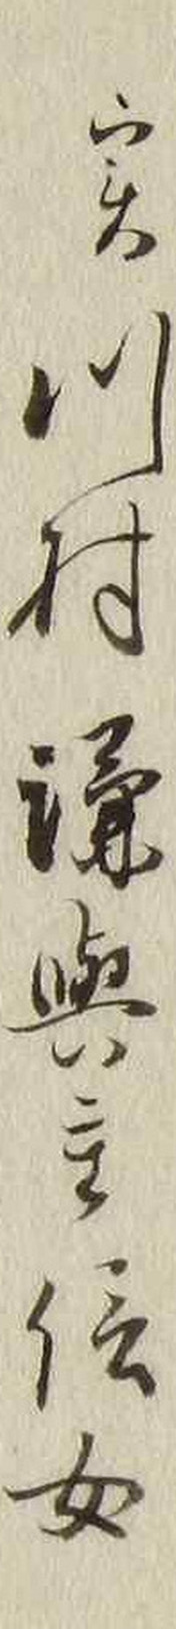実川村謙與重信女
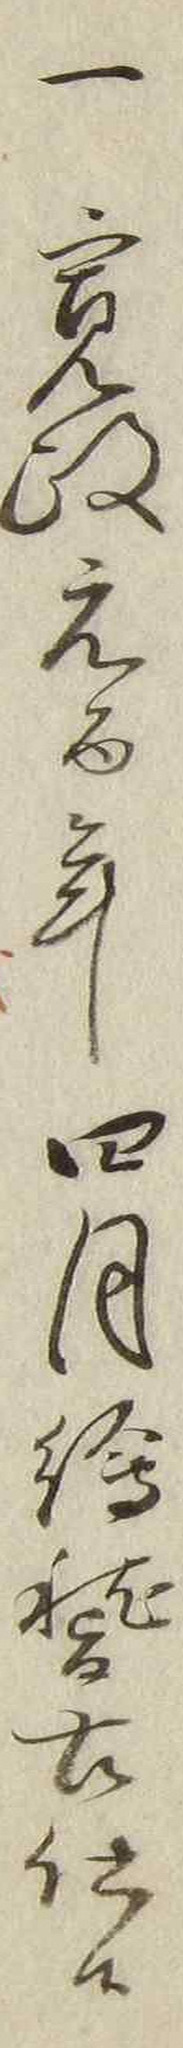一寬政元酉年四月絵稽古仕候

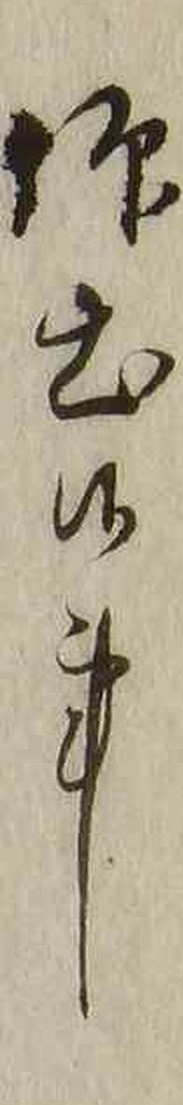仰出候事
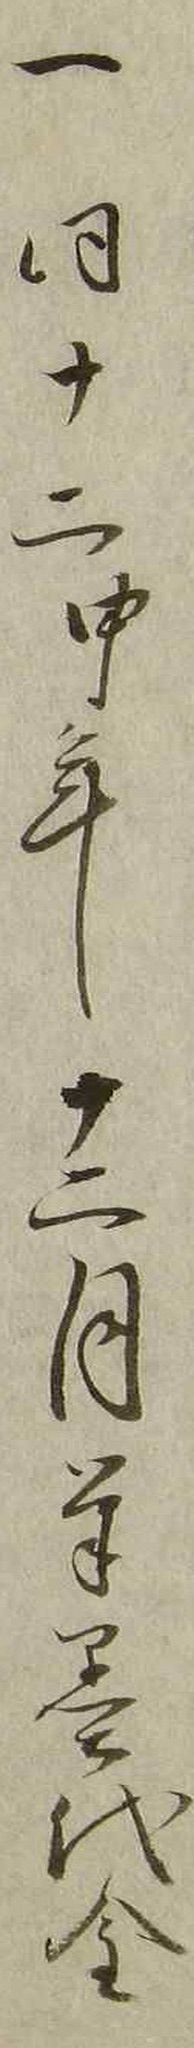一同十二申年十二月筆墨代金
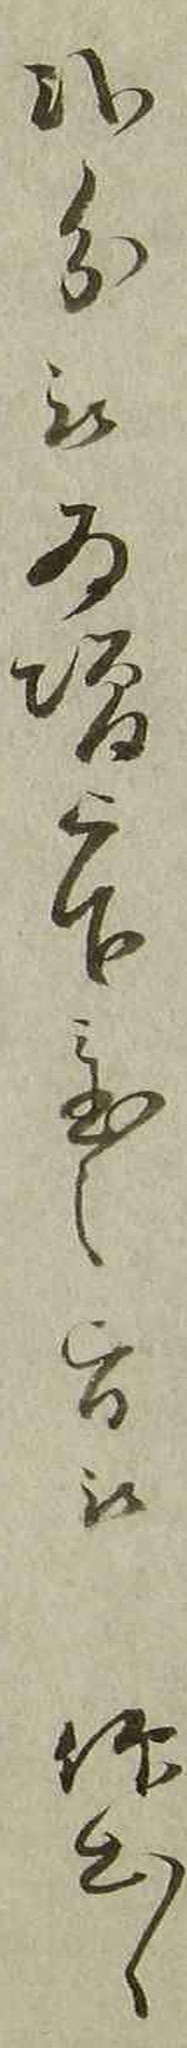弐分被為増被下置之旨被仰出候
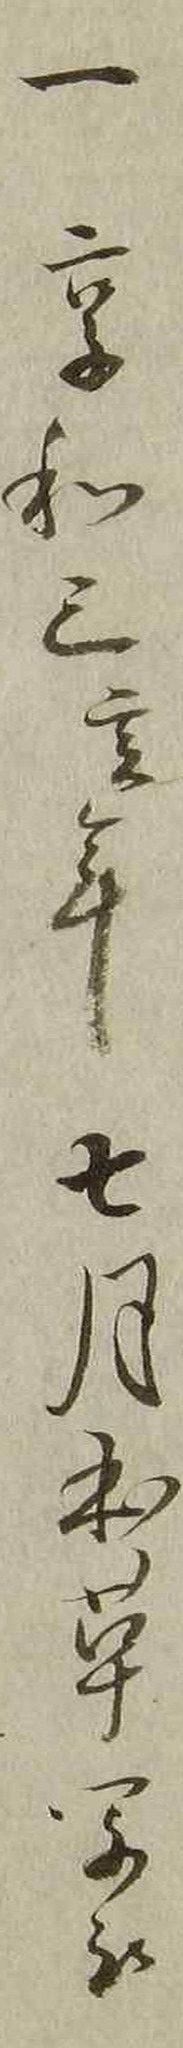一享和三亥年七月本草写被
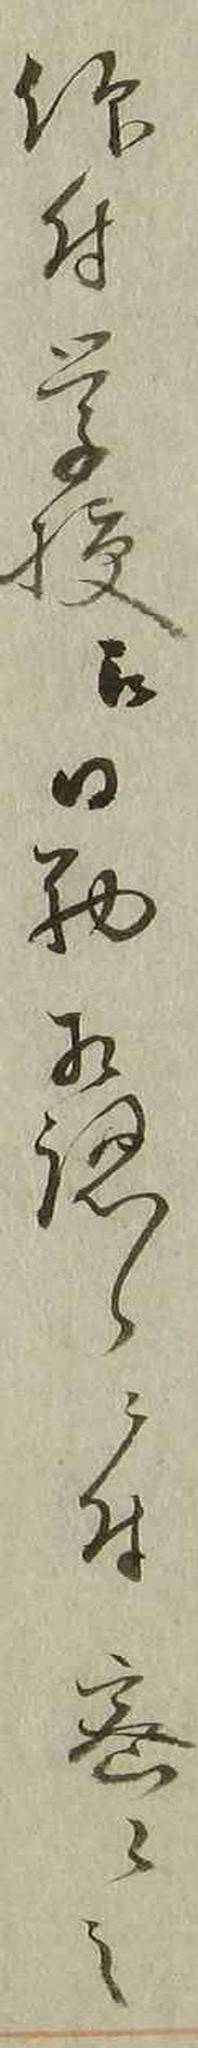仰付学授江日勤相認候ニ付蜜々之
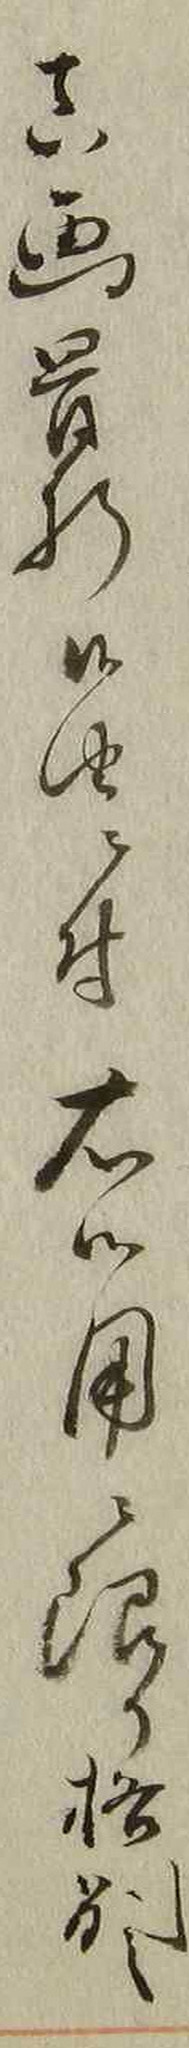古画骨折候由ニ付右御用ニ限り拾別之
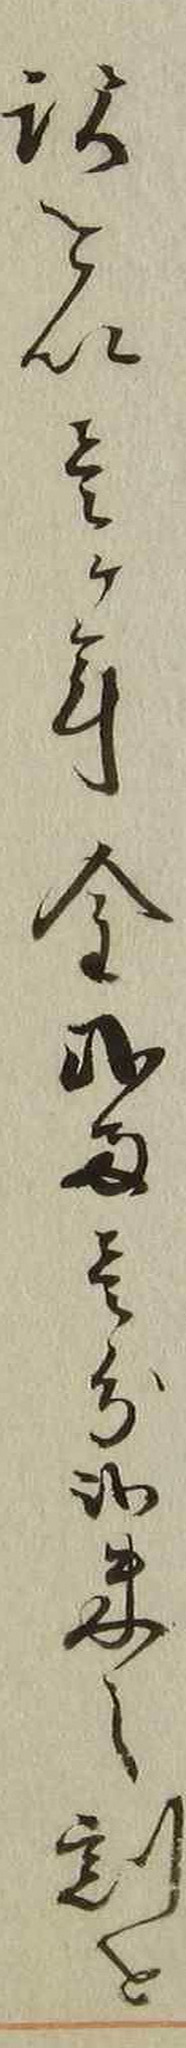訳を以壱ケ年金弐両壱分御朱之割を
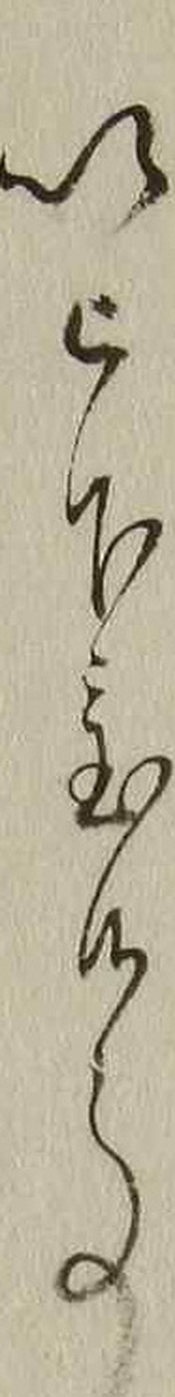以被下置候事
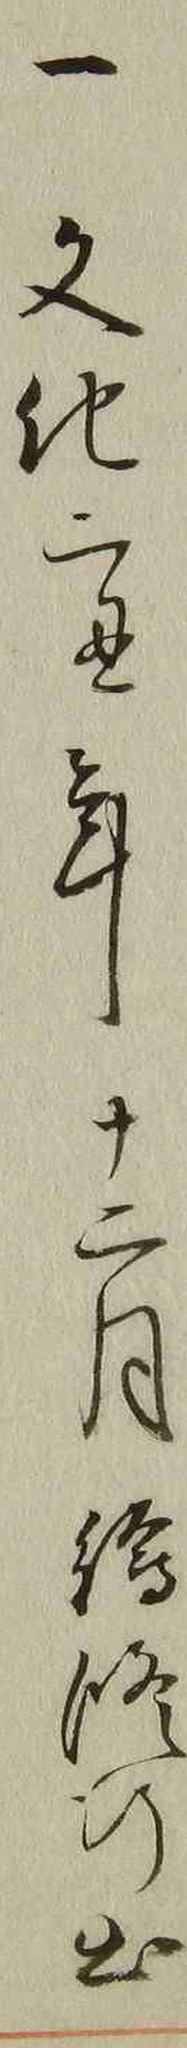一文化二丑年十二月絵修行出
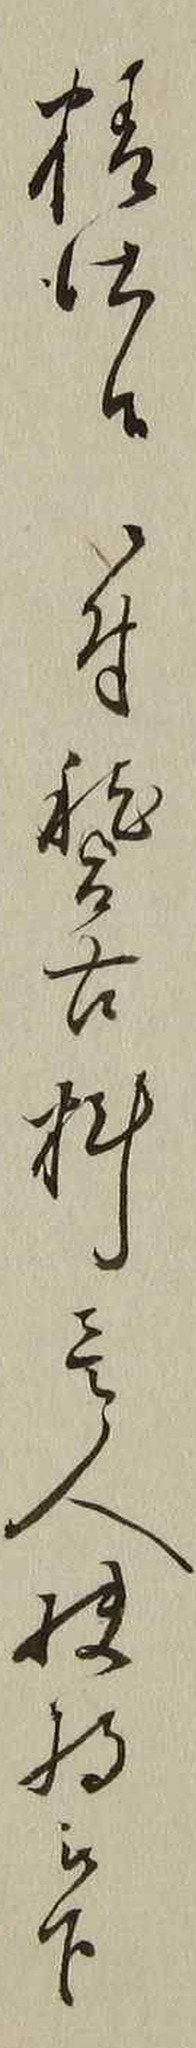精仕候ニ付稽古料壱人扶持被下
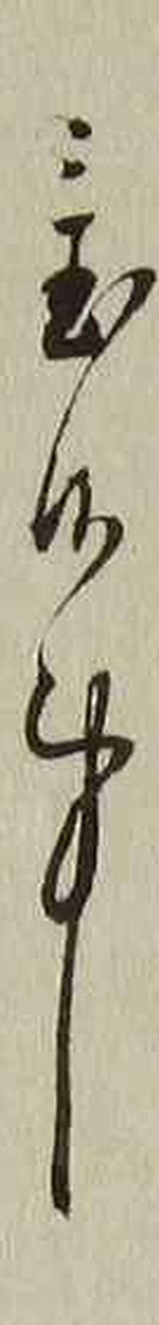置候事
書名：諸士系譜　巻之132　た之部8
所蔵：会津若松市立会津図書館
